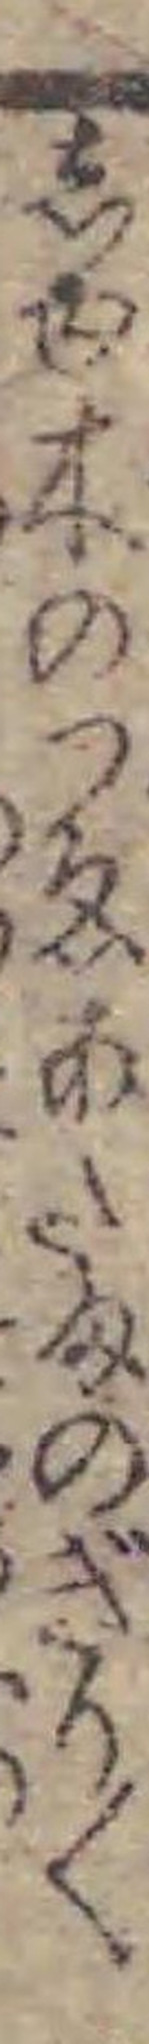しゆ木のつゑあたまのぎり〳〵
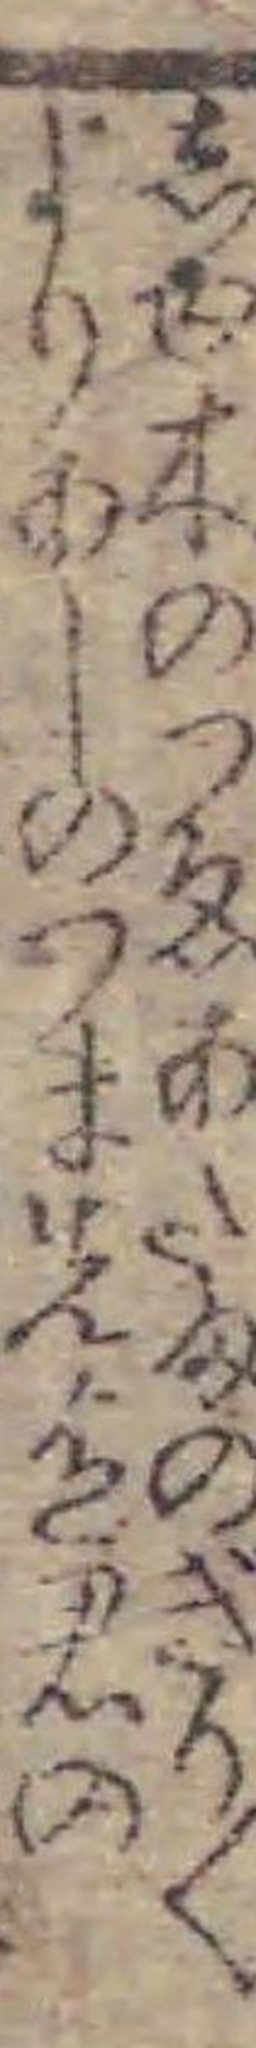よりあしのつま先迄君の
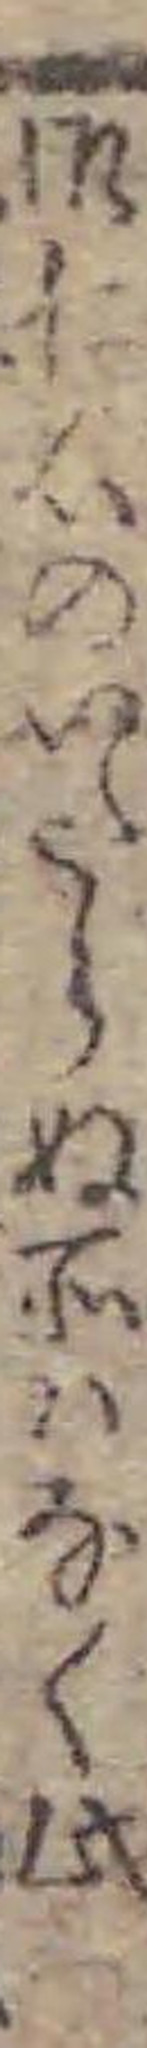御仁心のいたらぬ所はなく此
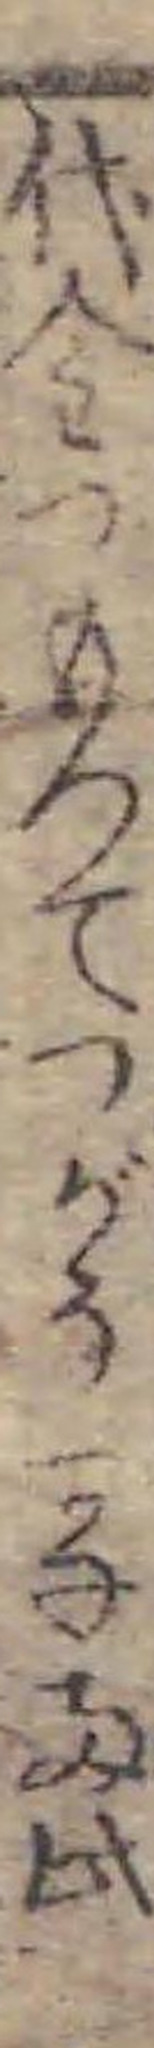代金つもつてつがう一千両此
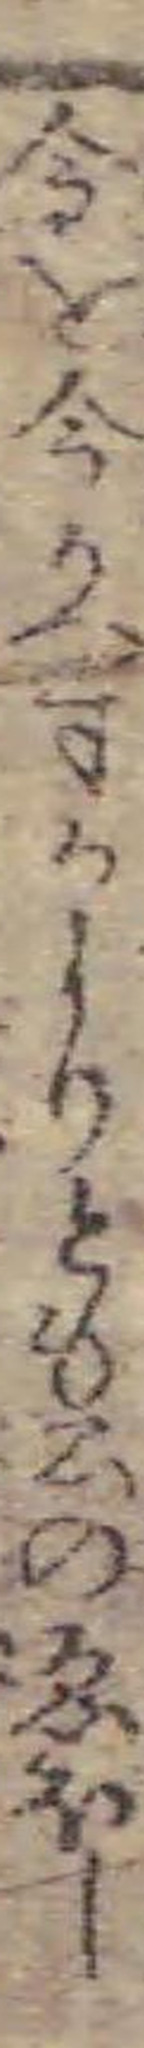金を今かへすかよりとも公のゑぼし
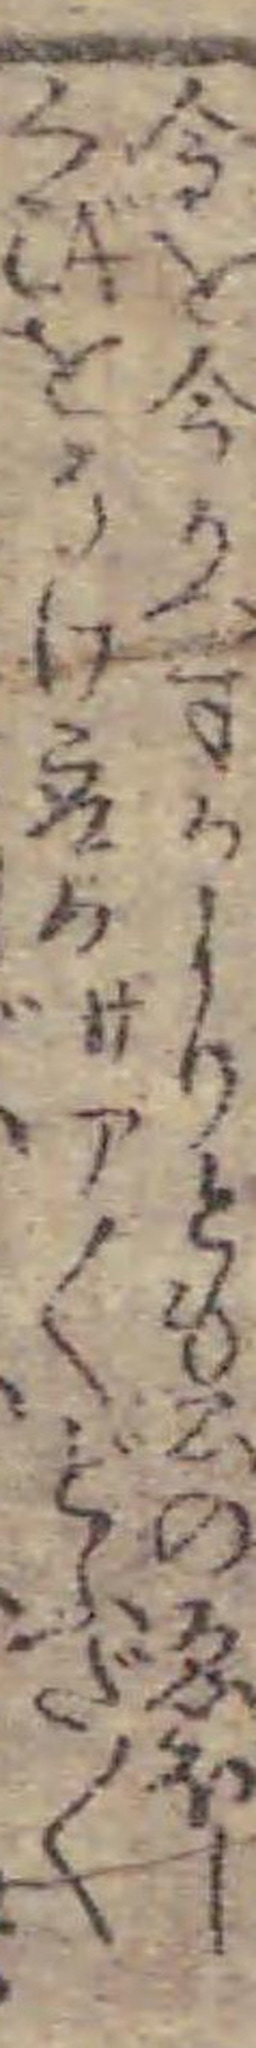くびをうけ取かサア〳〵どふだ〳〵
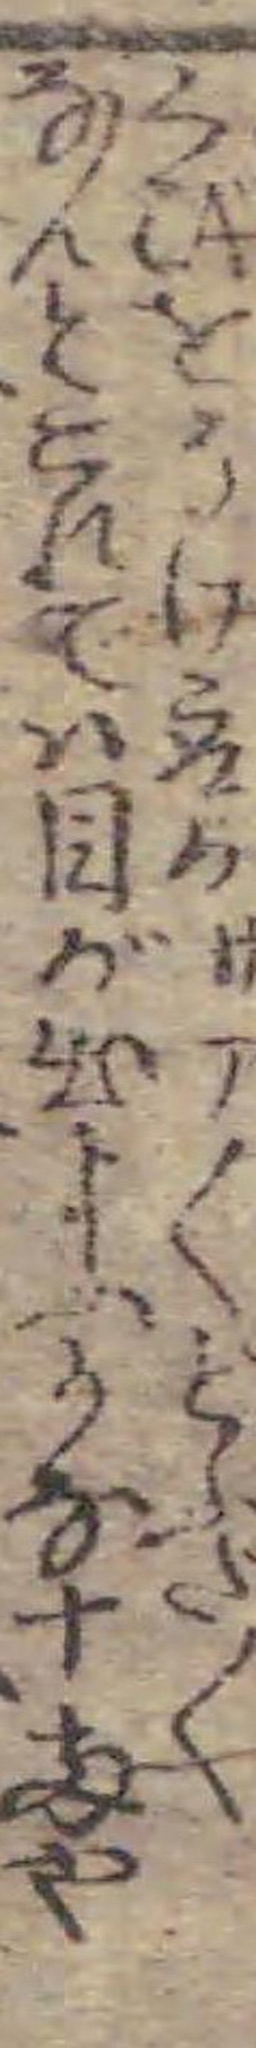なんとこれでは目が出よふかな十両や
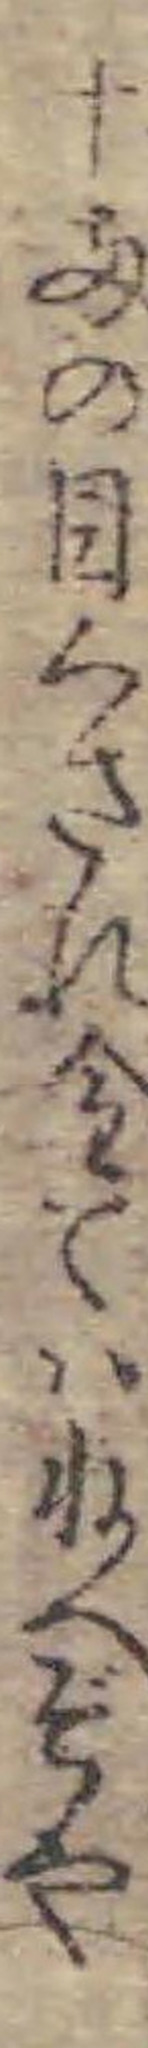十両の目くされ金てはねへぞや
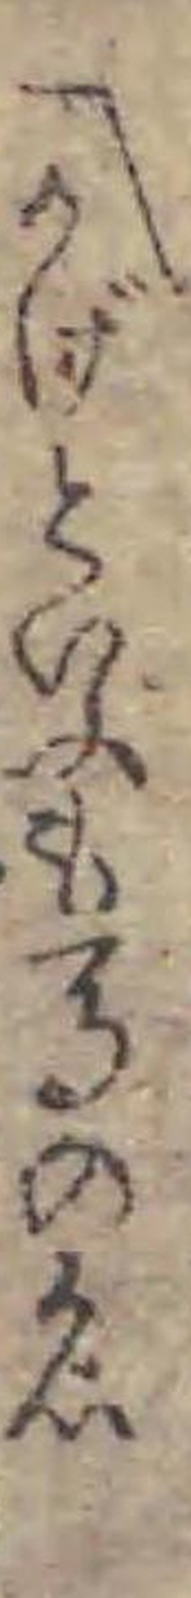〽かげといふも馬の名
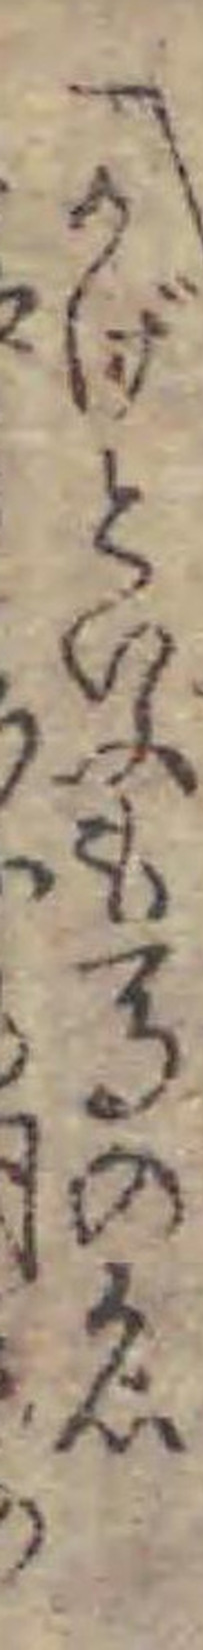〽かげといふも馬の名
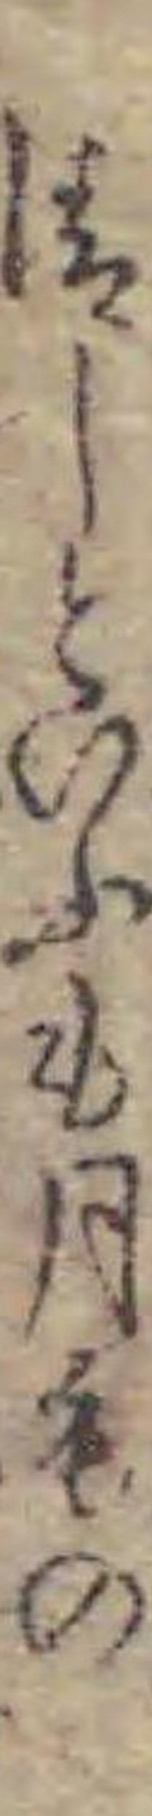清しといふも月毛の
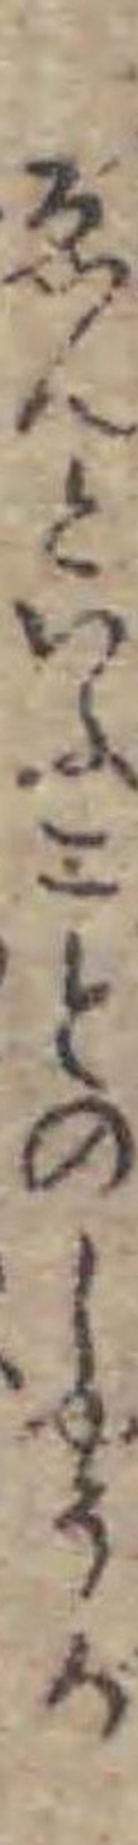ゑんといふことのしやうが
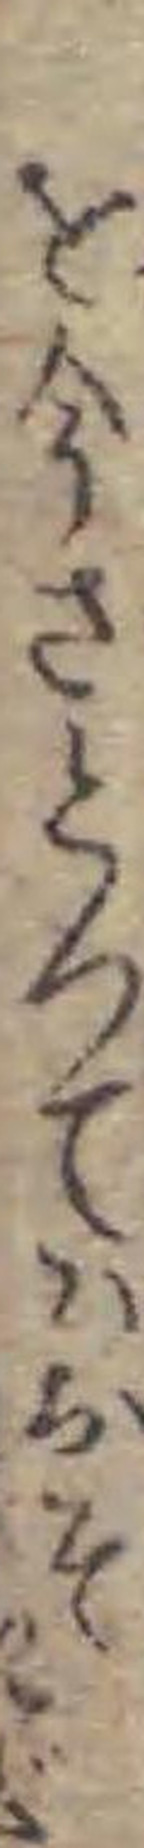を今さとつてはおそ
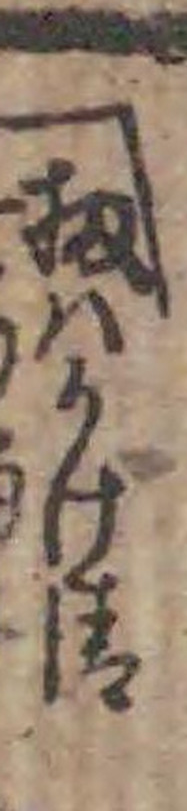〽扨はかけ清
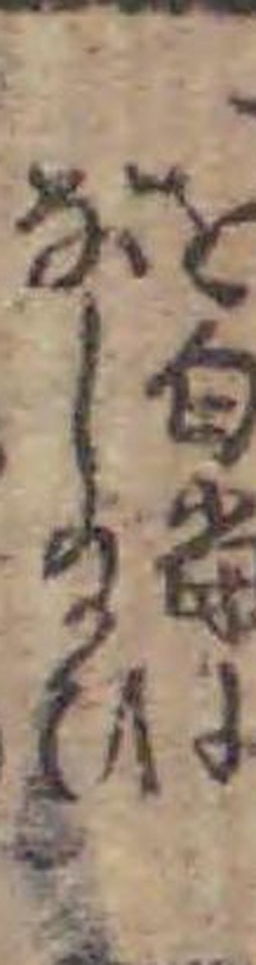なし給ひ
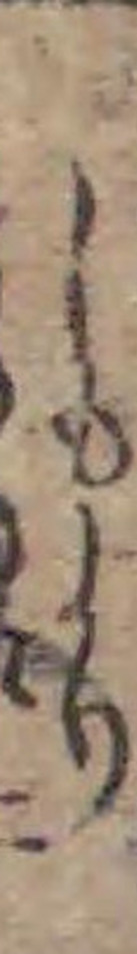しもより
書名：悪七変目景清 : 2巻
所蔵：国立国会図書館 National Diet Library, JAPAN
